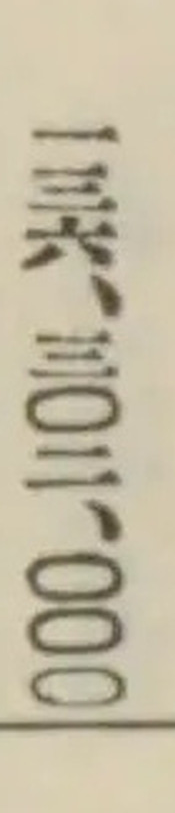計一三六、三〇二、〇〇〇
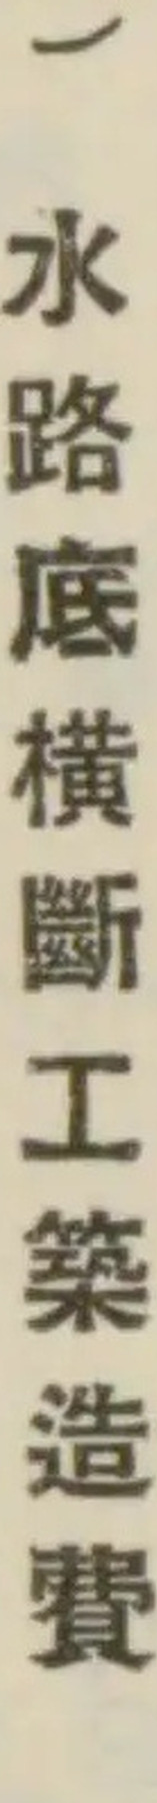(三)水路底横断工築造費
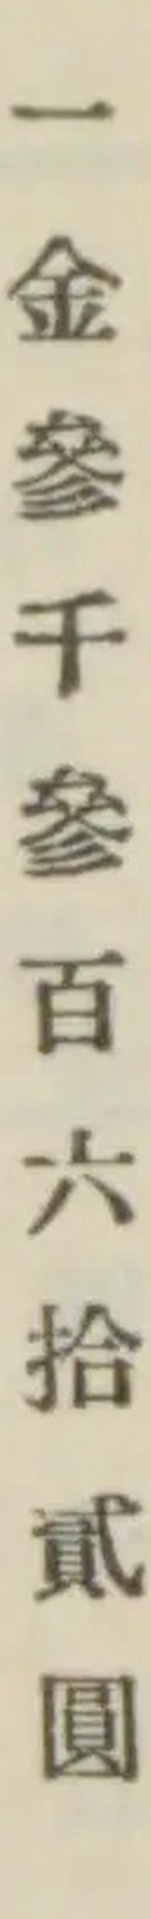一金參千參百六拾貳圓
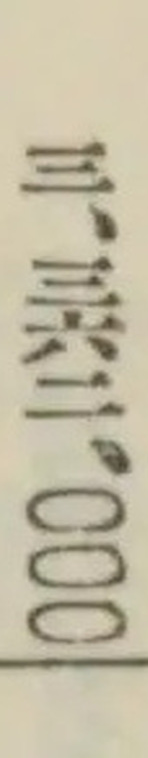計三、三六二、〇〇〇
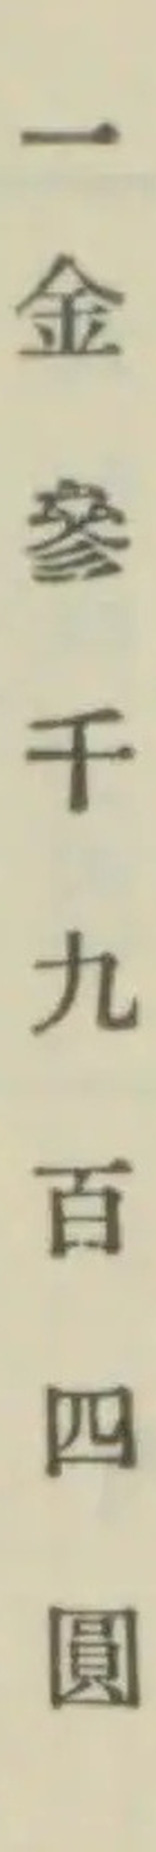一金參千九百四圓
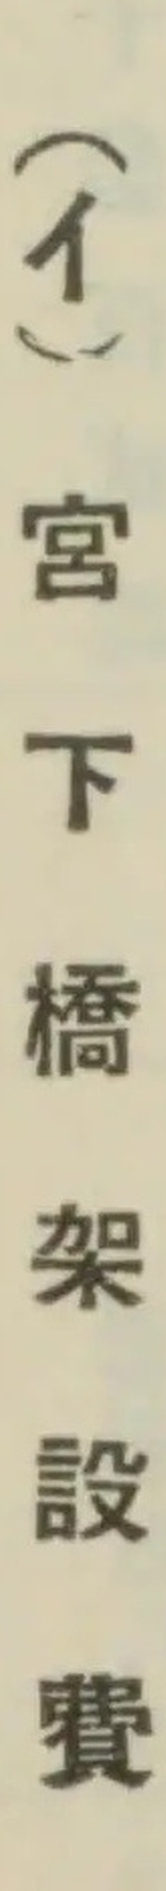(イ)宮下橋架設費
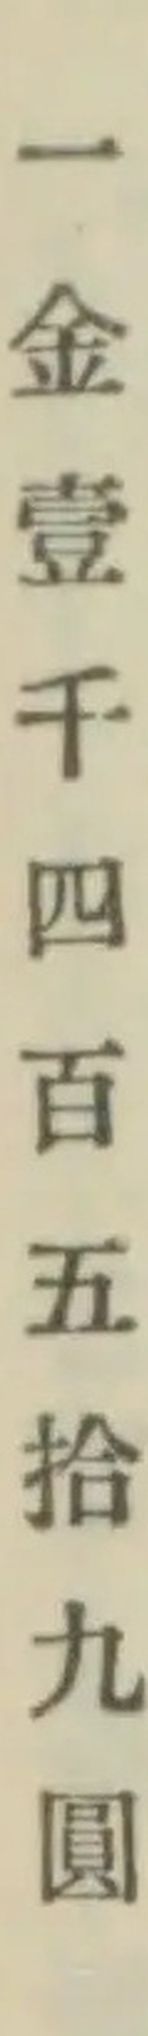一金壹千四百五拾九圓

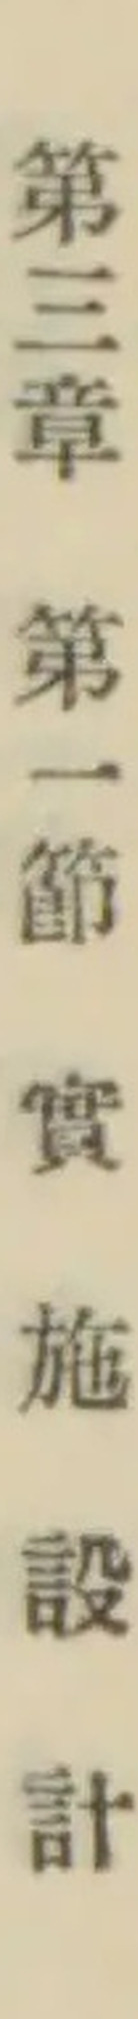第三章第一節実施設計
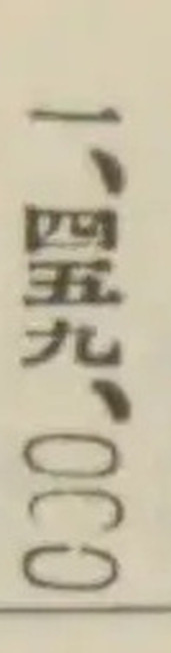計一、四五九、〇〇〇
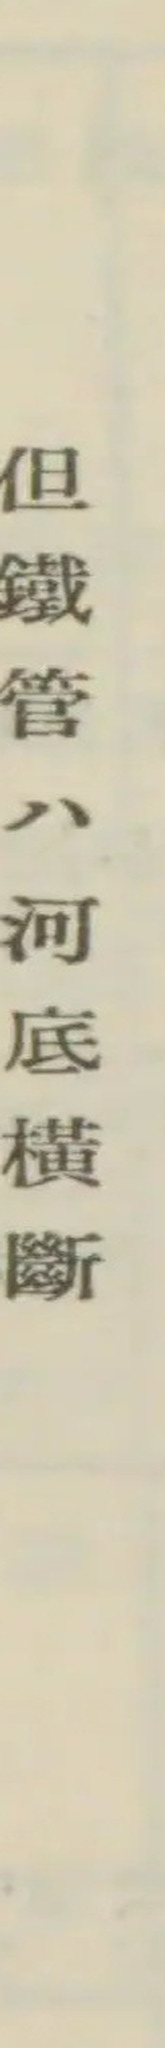但手鐵管は河底横断
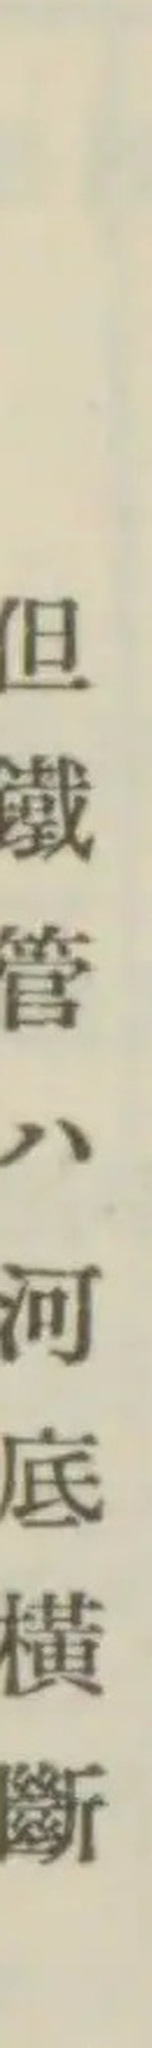但手鐵管は河底横断
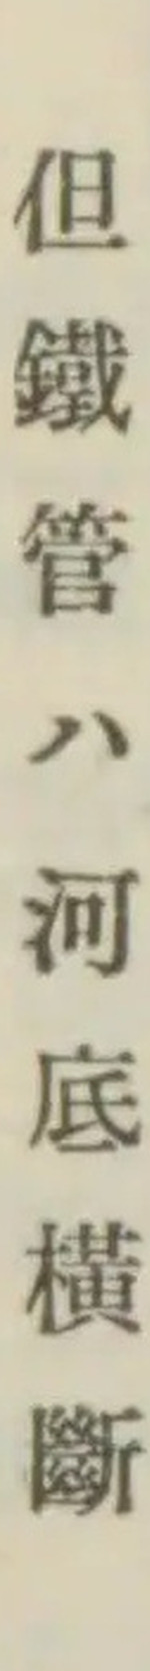但手鐵管は河底横断
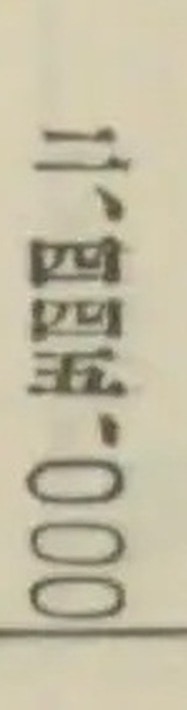計二、四四五、〇〇〇
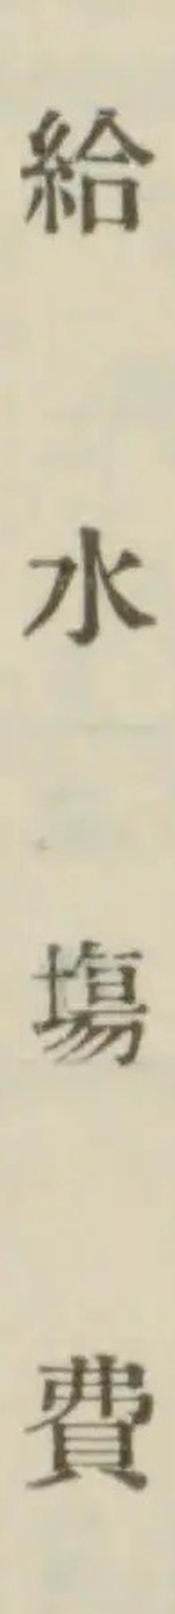給水場費
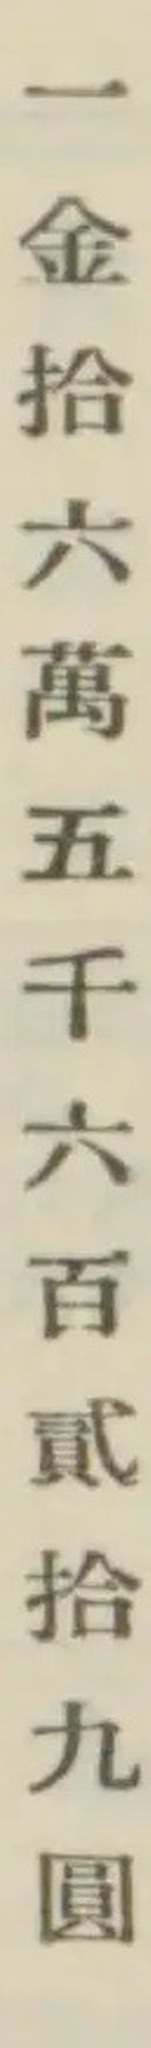一金六萬五千六百貳拾九圓
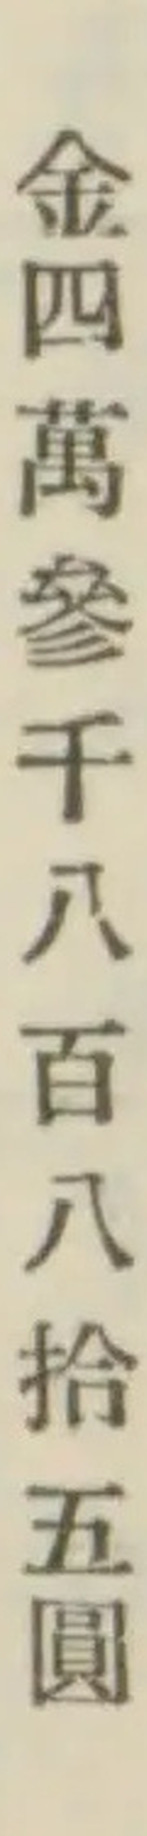一金四萬參千八百八拾五圓
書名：豊橋市水道誌
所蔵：国立国会図書館 National Diet Library, JAPAN
